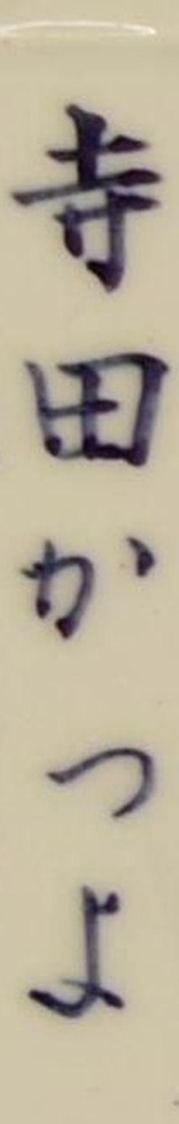寺田かつよ
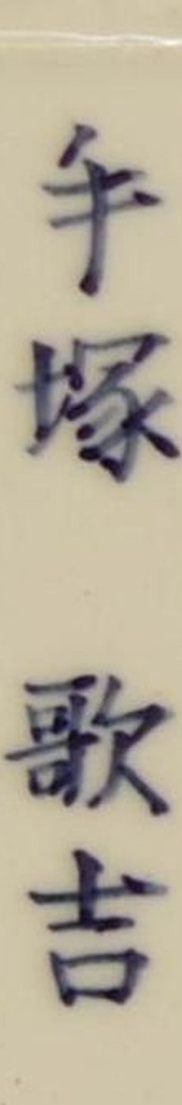手塚歌吉
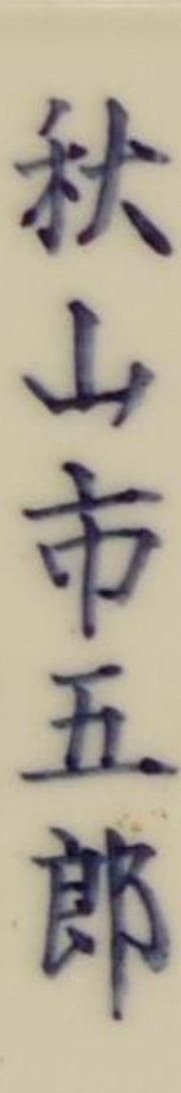秋山市五郎

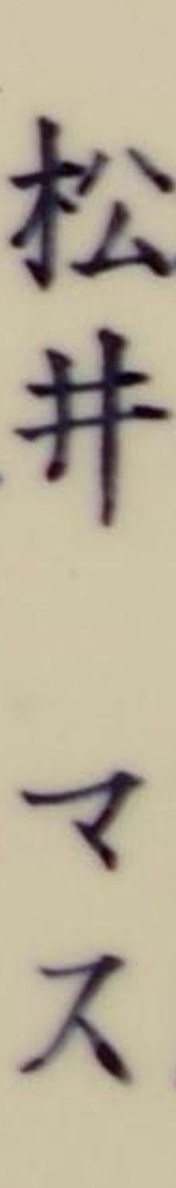松井マス
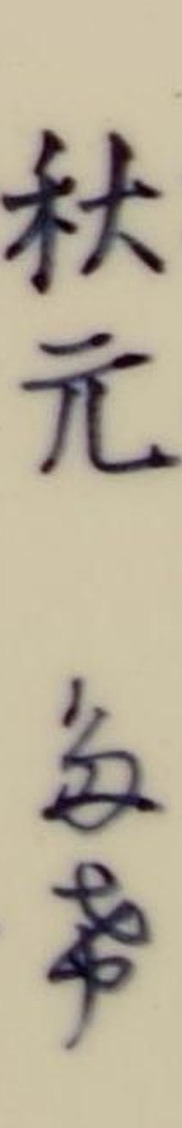秋元たけ
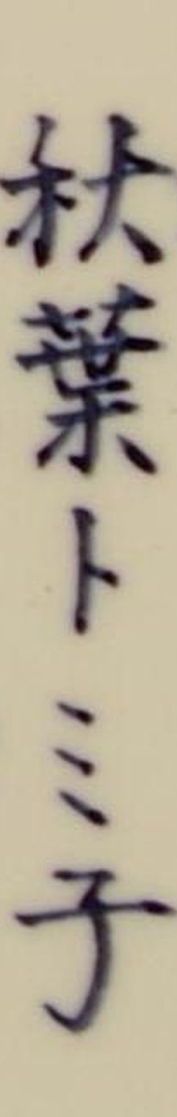秋葉トミ子
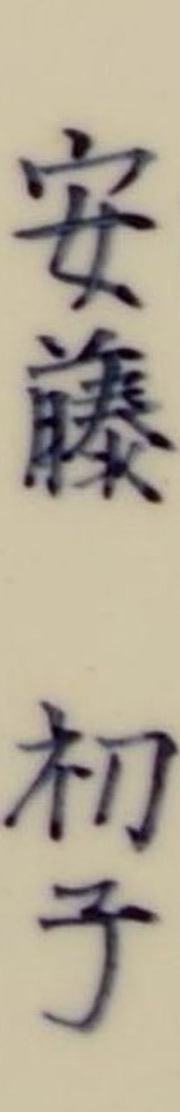安藤初子
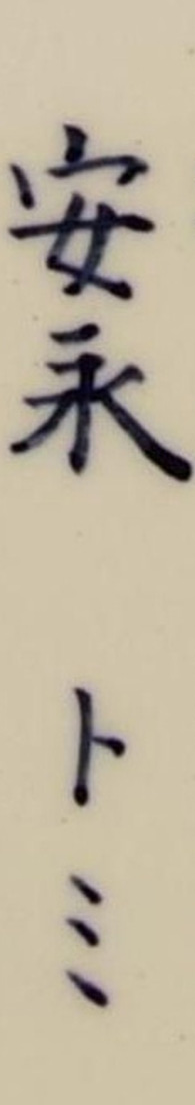安永トミ
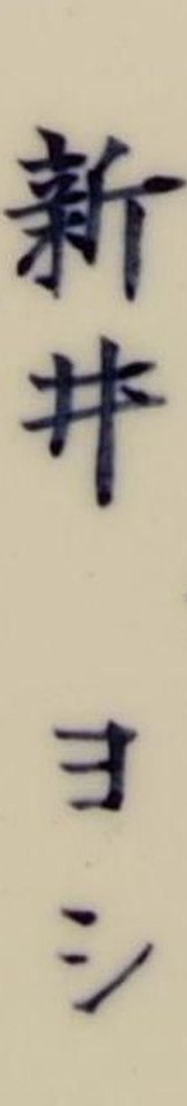新井ヨシ
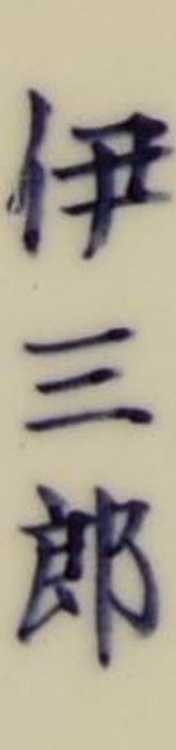伊三郎
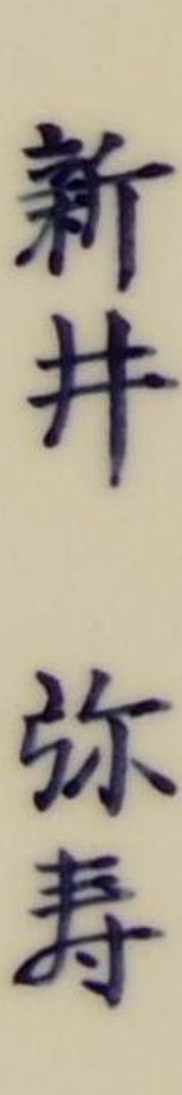新井弥寿
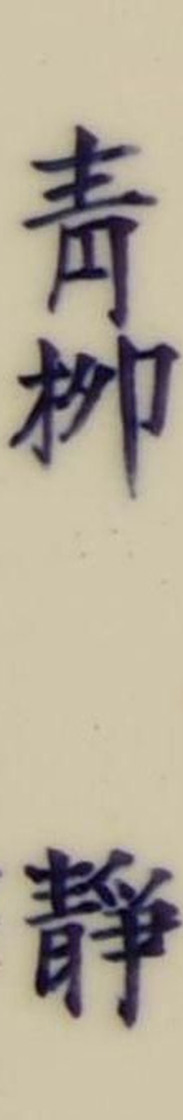青柳静

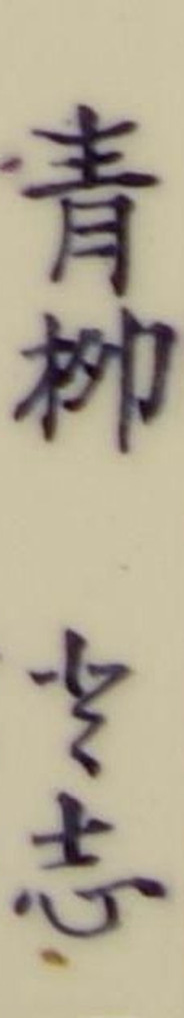青柳とし
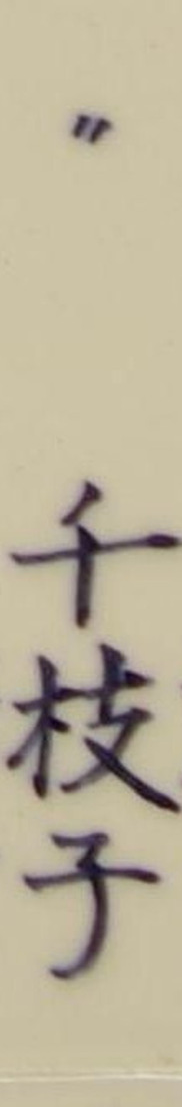千枝子
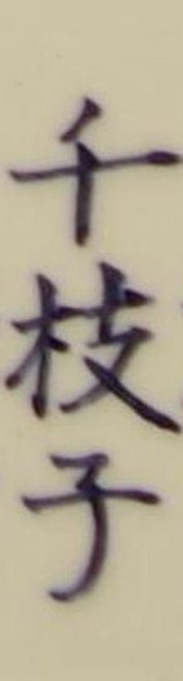千枝子
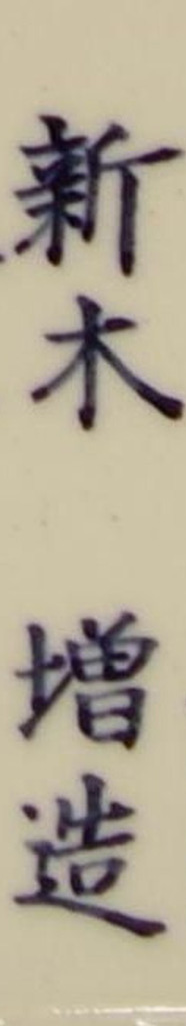新木増造
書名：E~L
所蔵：高野山金剛峯寺
